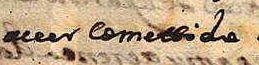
auer comettido.
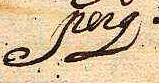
perqto.
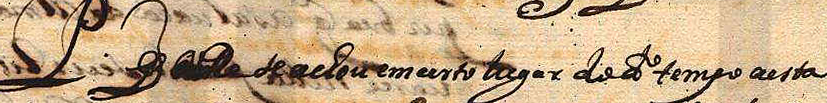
P q̄ a Re se achou em certo lugar do d̄o tempo a esta
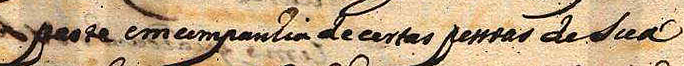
parte em companhia de certas pessoas de Sua
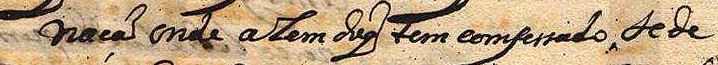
naçā onde alem do q̄ tem comfessado, se de
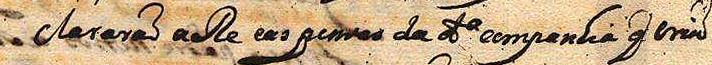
clararaõ a Re e as pessoas da d̄a companhia q̄ criā
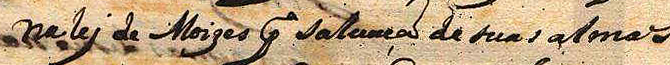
na lej de Moizes pa saluaçā de suas almas
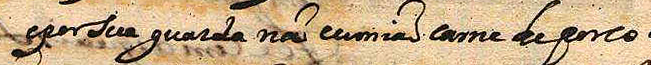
e por sua guarda nā comiaõ carne de porco.
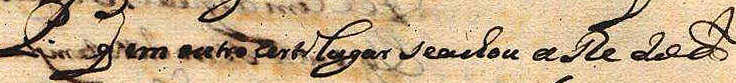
P. q̄ em outro certo lugar se achou a Re do d̄o
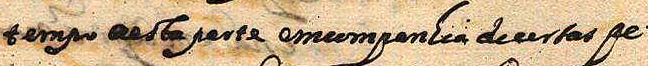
tempo a esta parte em companhia de certas pe
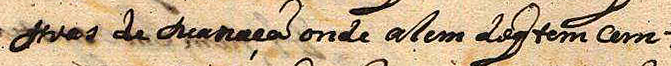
ssoas de sua naçā onde alem do q̄ tem com
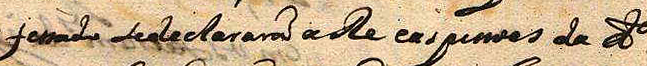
fessado se declararā a Re e as pessoas da d̄a
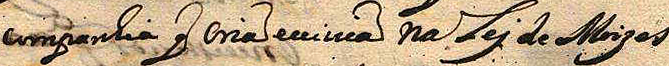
companhia q̄ criā e uiuiā na Lej de Moizes
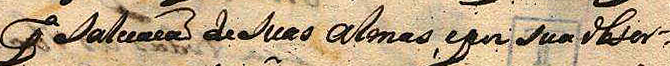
pa Saluacā de Suas almas, e por sua obser
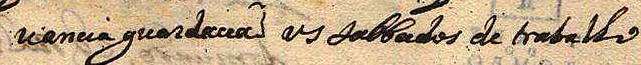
uancia guardauaõ os sabbados de trabalho
